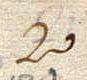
20
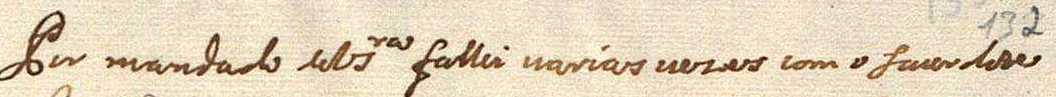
Por mandado de V sra fallei uarias uezes com o sacerdote
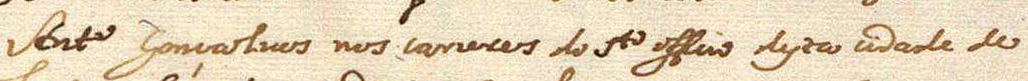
Anto Gonçalues nos carceres do sto officio desta cidade de
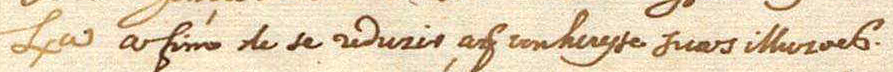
Lxa ao fim de se reduzir a q̄ conhecesse suas illuzoes.
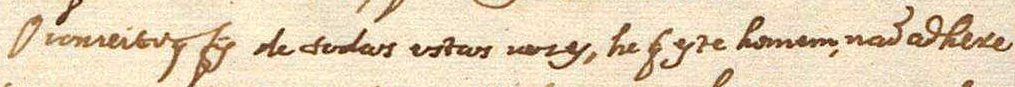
O conceito q̄ fis de todas estas uezes, he q̄ este homem, naõ adhere
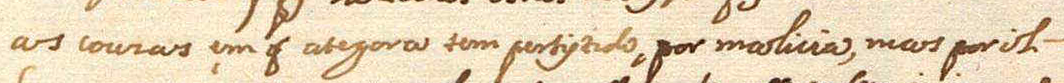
as couzas em q̄ ategora tem persistido, por malicia, mas por iL
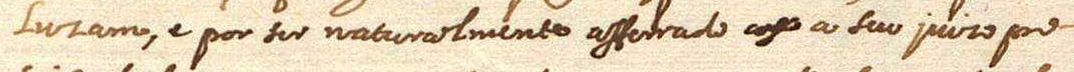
Luzam, e por ser naturalmente afferrado caso a seu juizo pro
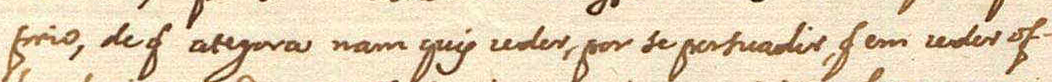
prio, de q̄ ategora nam quis ceder, por se persuadir, q̄ em ceder of
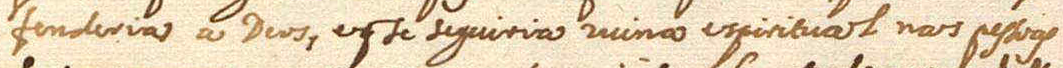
fenderias a Deos, e q̄ se seguiria ruina espiritual nas pessoas
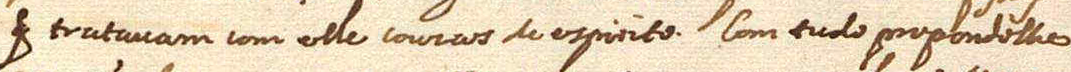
q̄ tratauam com elle couzas de espirito. Comtudo propondolhe
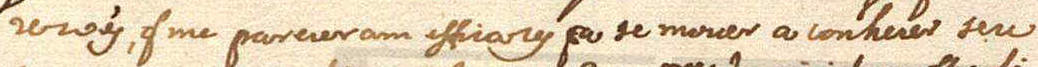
rezoẽs, q̄ me pareceram efficazes pa se mouer a conhecer seu
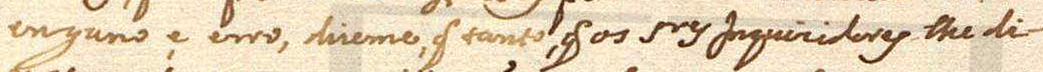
engano, e erro, diceme, q̄ tanto, q̄ os sres Jnquizidores lhe di
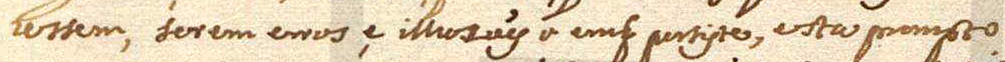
zessem, serem erros, e illuzoẽs o em q̄ persiste, esta prompto
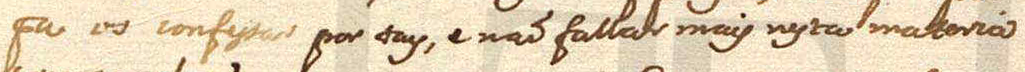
pa os confessar por tais, e naõ fallar mais nesta materia
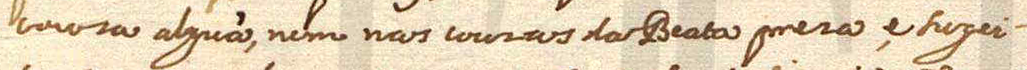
couza alguā, nem nas couzas da Beata preza, e sugei
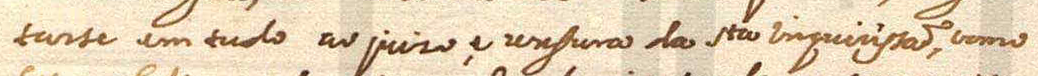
tarse em tudo ao juizo, e censura da sta Inquizissaõ, como
